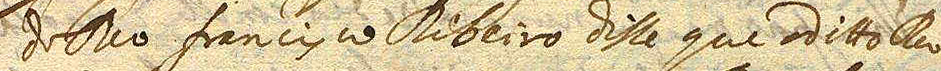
do Reo francisco Ribeiro disse que o ditto Reo
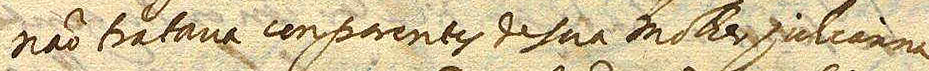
naõ trataua con parentes de sua molher julianna
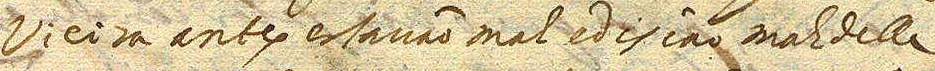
Vieira antes estauaõ mal e disião mal delle
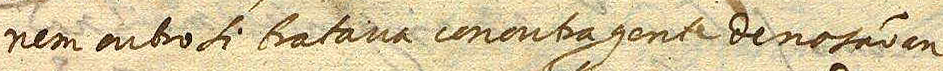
nem outrosi trataua con outra gente de nasaõ an
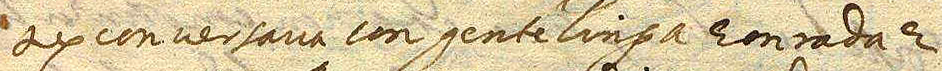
tes conuersaua con gente linpa E onrada E
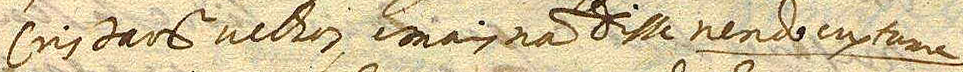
Cristaõs uelhos, e mais naõ disse nen do custume
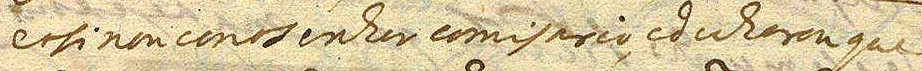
e asinou con o senhor comisario, e declarou que
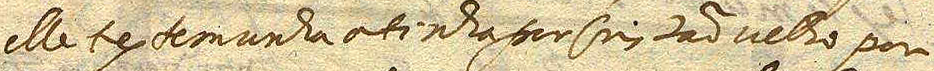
elle testemunha o tinha por Cristaõ uelho por
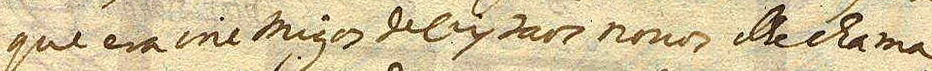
que era inemigos de cristaos nouos elle chama
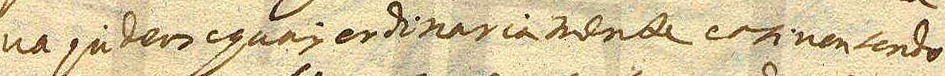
ua judeos e quais ordinariamente e asinou sendo
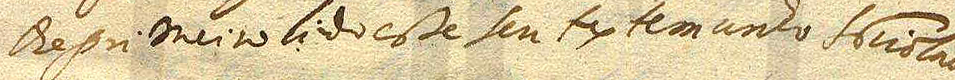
lhe primeiro lido este seu testemunho Nicolao
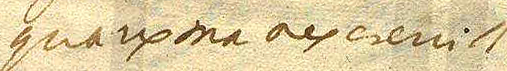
quaresma o escreui //
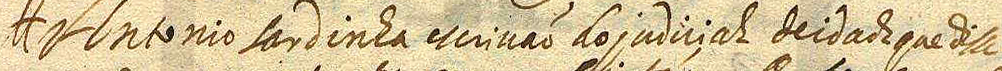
item Antonio sardinha escriuaõ do judiçiaL de idade que disse
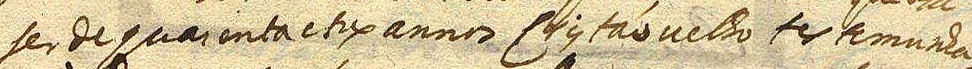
ser de quarenta e tres annos Cristaõ uelho testemunha
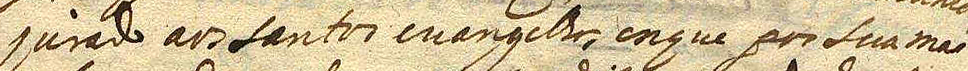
jurado aos santos euangelhos, en que pos sua maõ
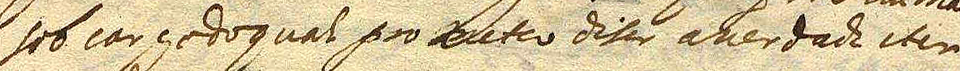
sob cargo do qual prometeo diser a uerdade e ter
